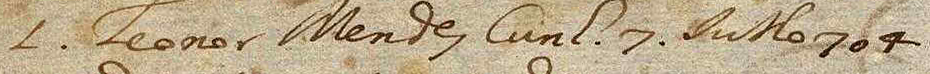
1. Leonor Mendes Cunh. 7. Iulho 704
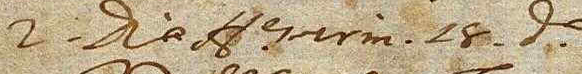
2. D à H.es irm. 18. d.o
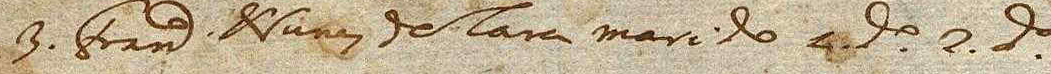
3. Franco. Nunes de Lara marido 1. d.o 2. d.as
